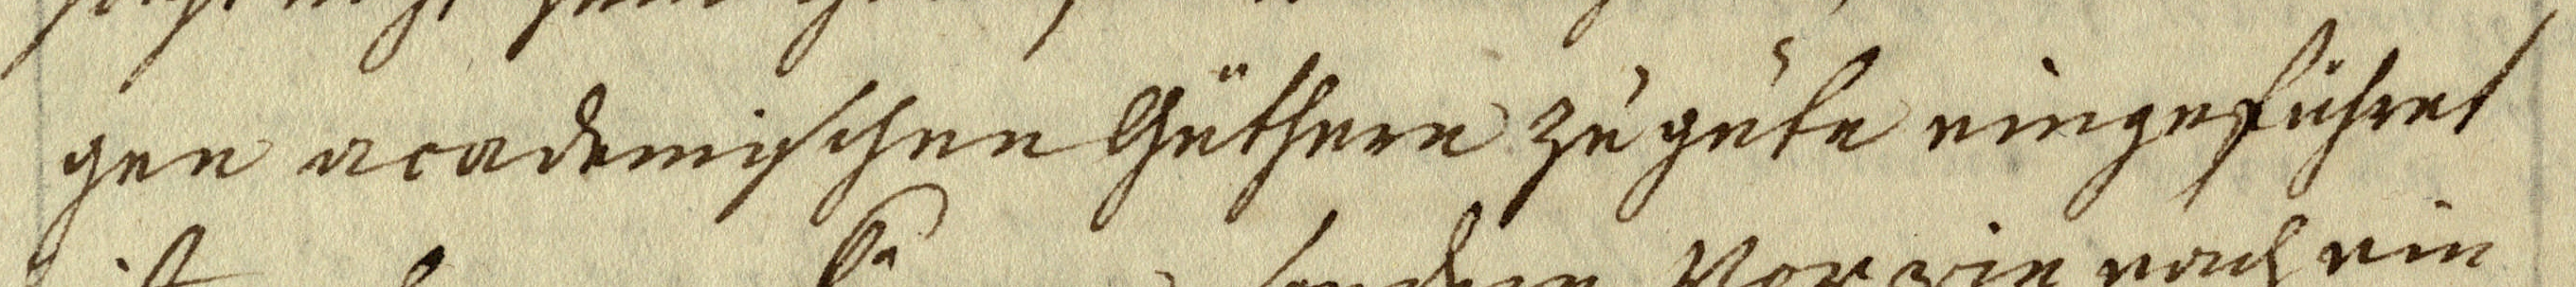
gen academischen Güthern zu gute eingeführet
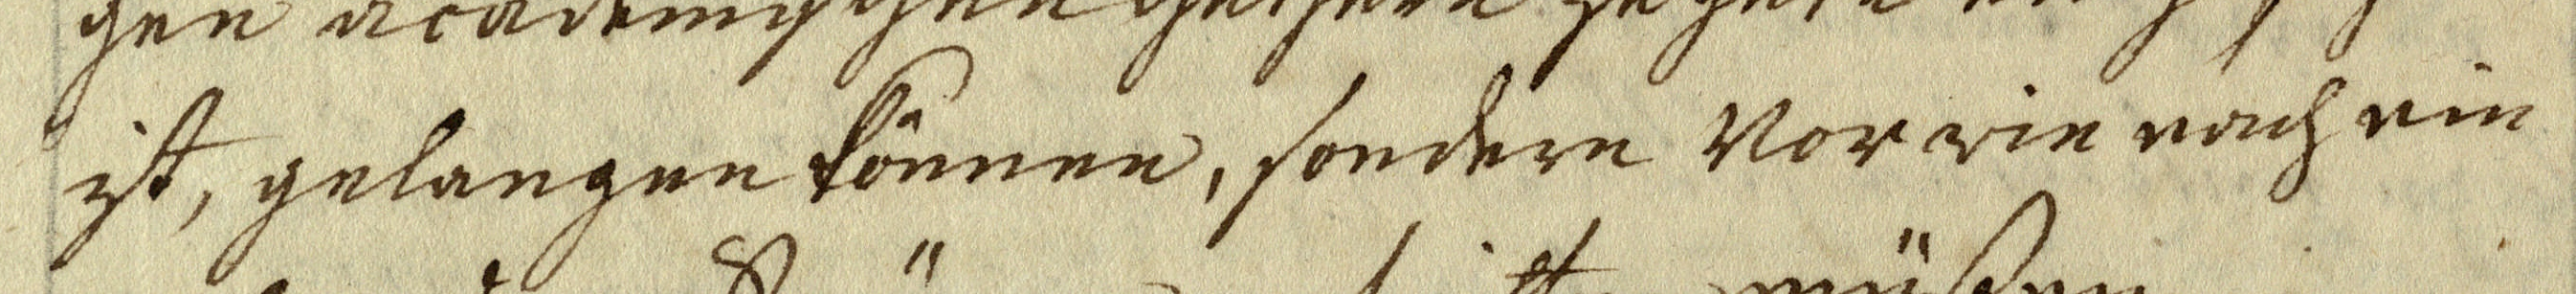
ist, gelangen können, sondern vor wie nach ein
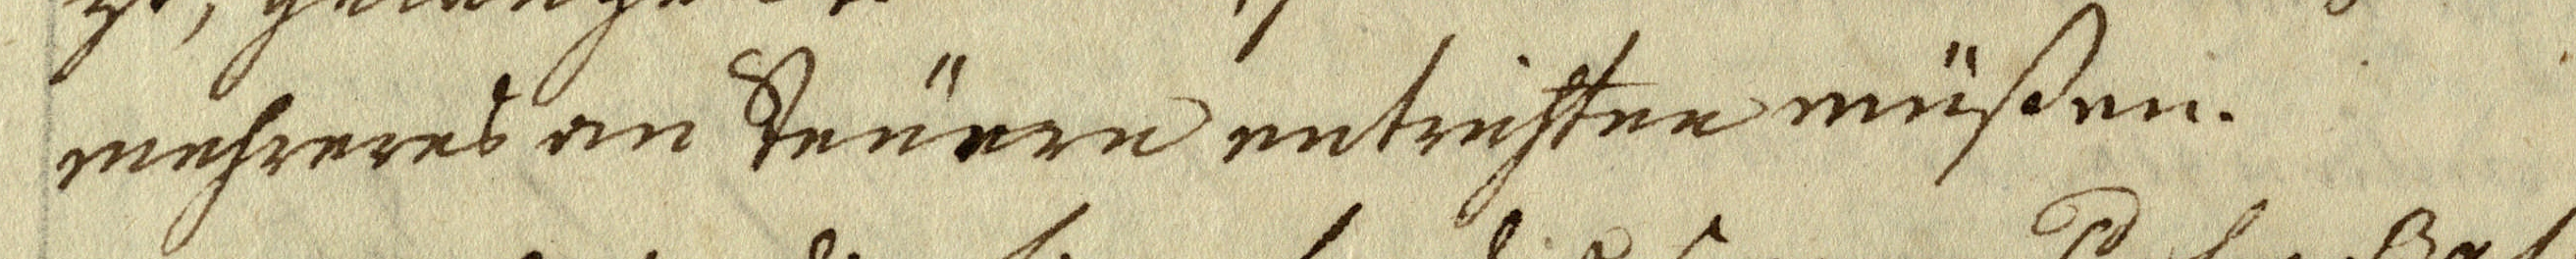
mehreres an Steuern entrichten müßen.
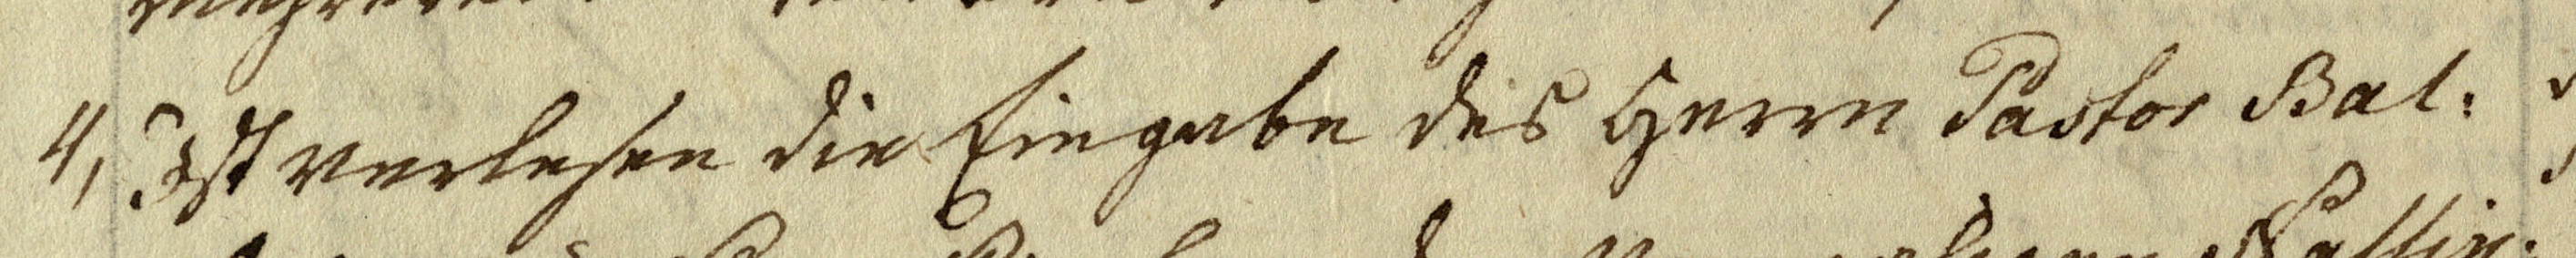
4, Ist verlesen die Eingabe des Herrn Pastor Bal¬
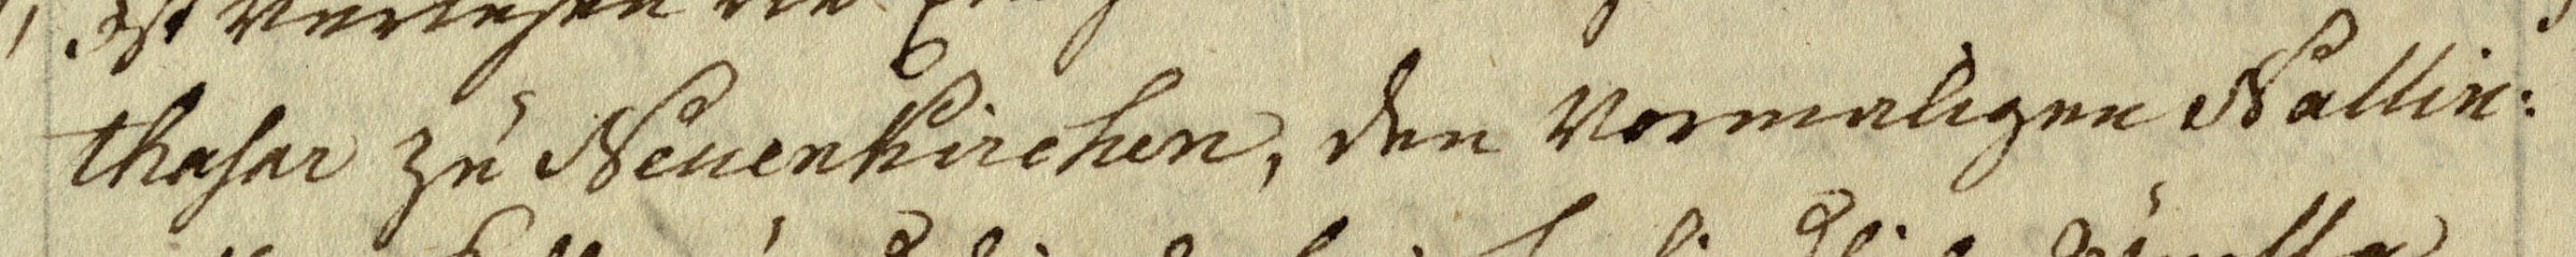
thasar zu Neuenkirchen, den vormaligen Nallin¬
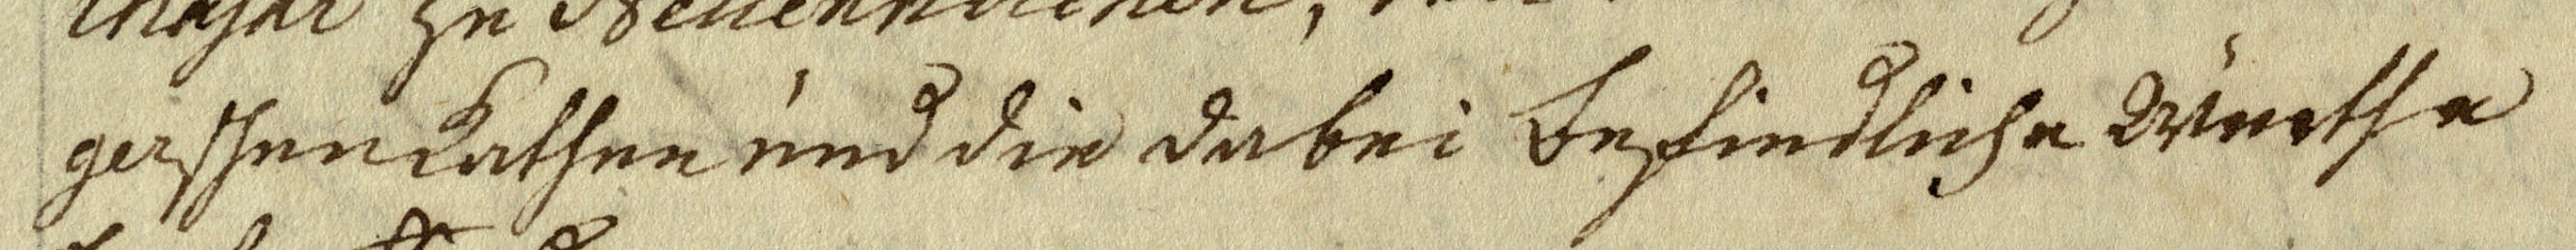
gerschen Kathen und die dabei befindliche Wurthe
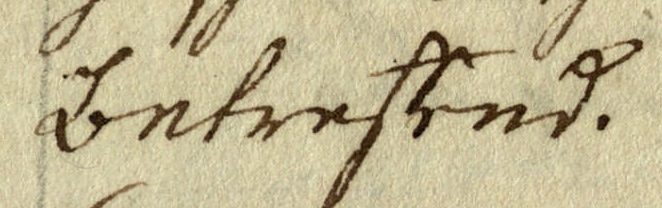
betreffend.
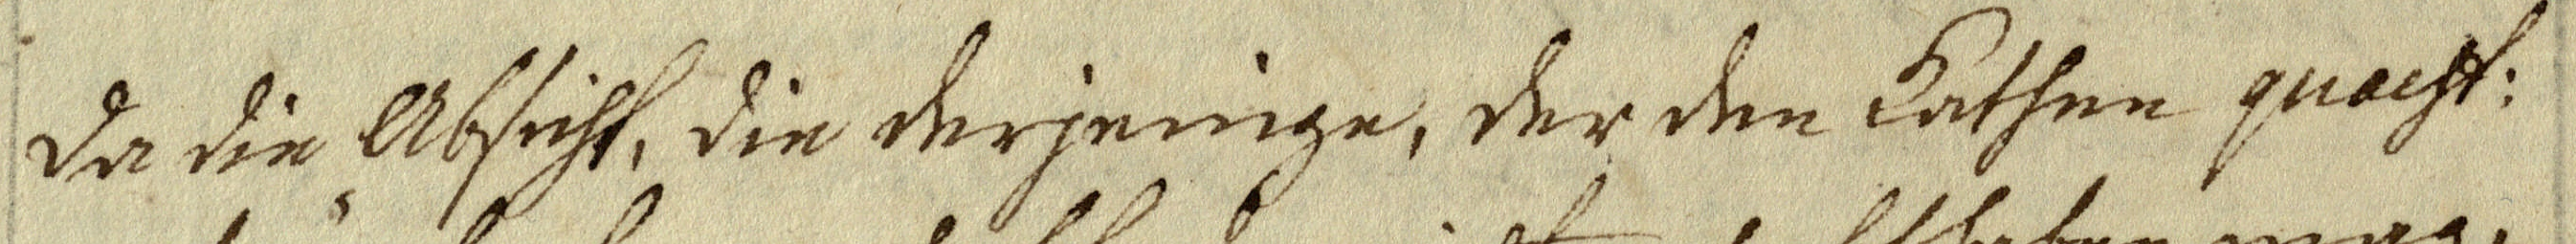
Da die Absicht, die derjenige, der den Kathen quaest.
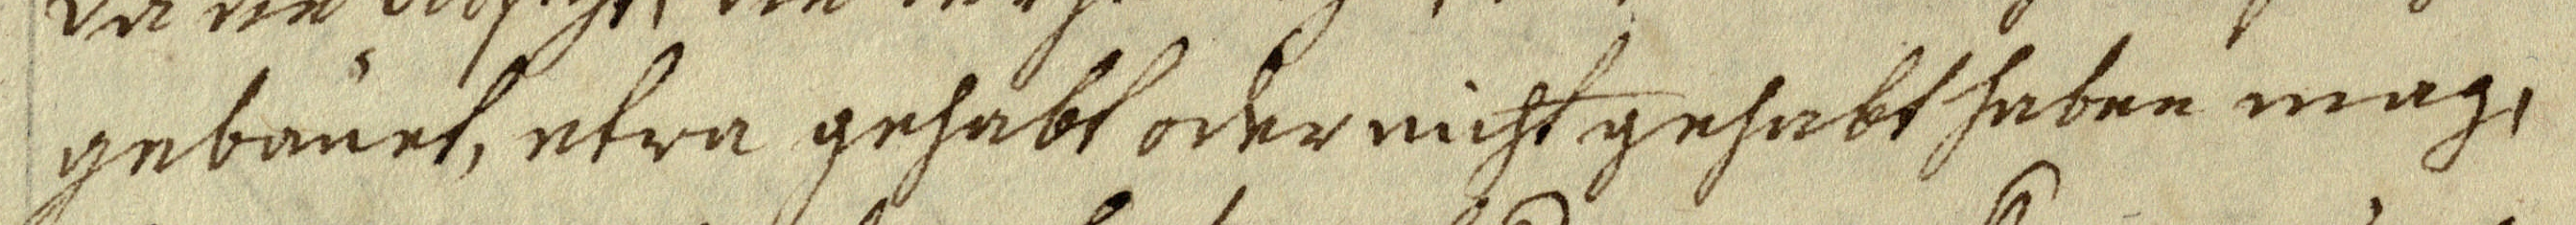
gebauet, etwa gehabt oder nicht gehabt haben mag,
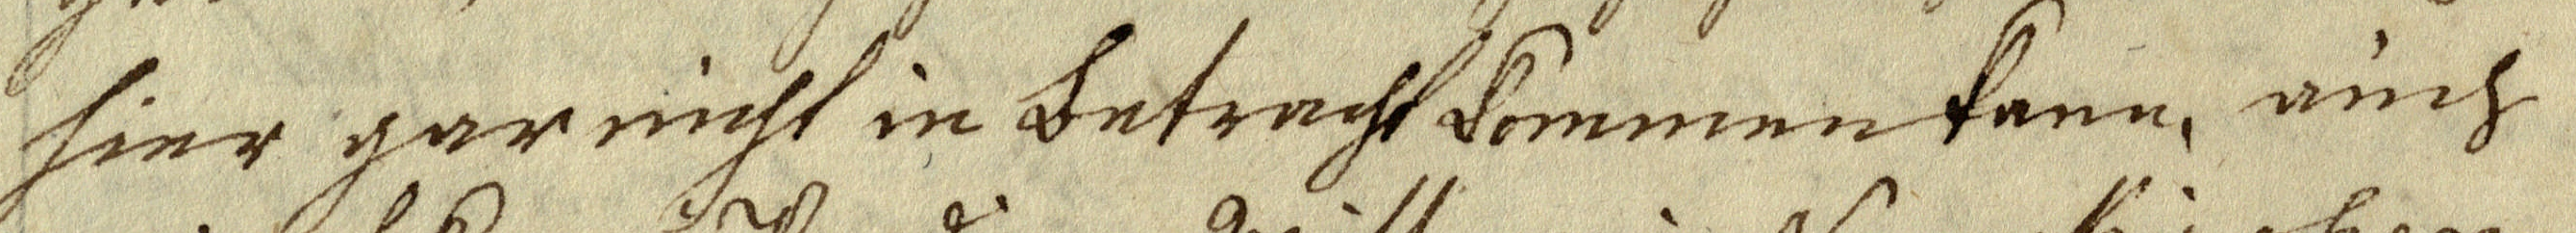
hier gar nicht in Betracht kommen kann, auch
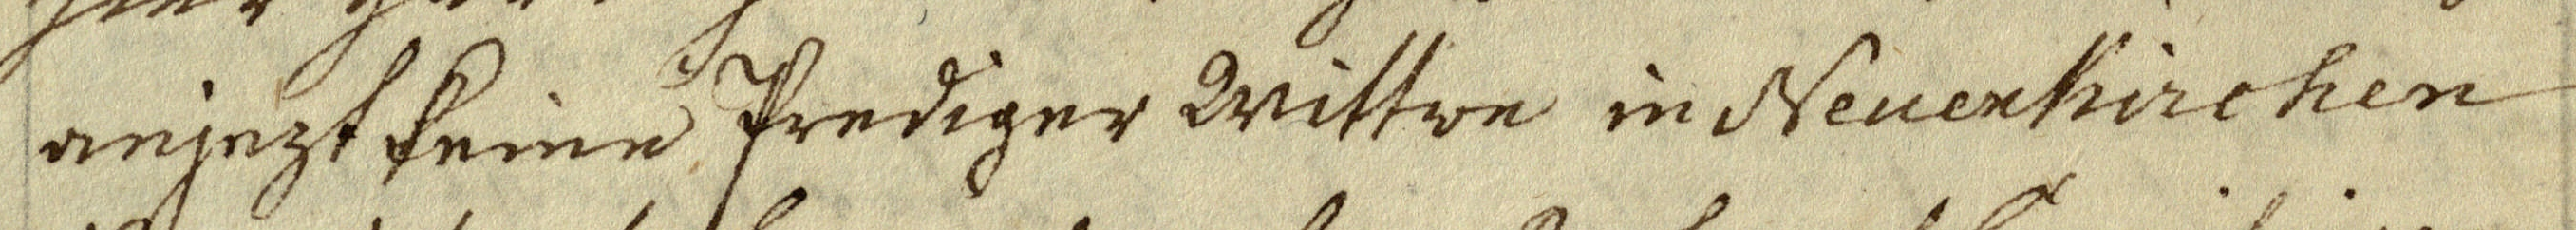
anjezt keine Prediger Wittwe in Neuenkirchen
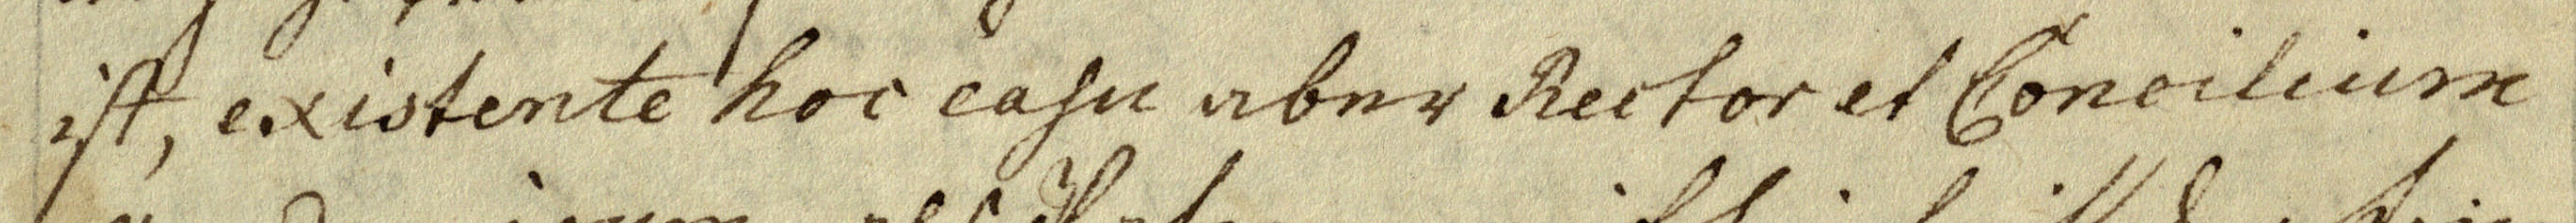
ist, existente hoc casu aber Rector et Concilium
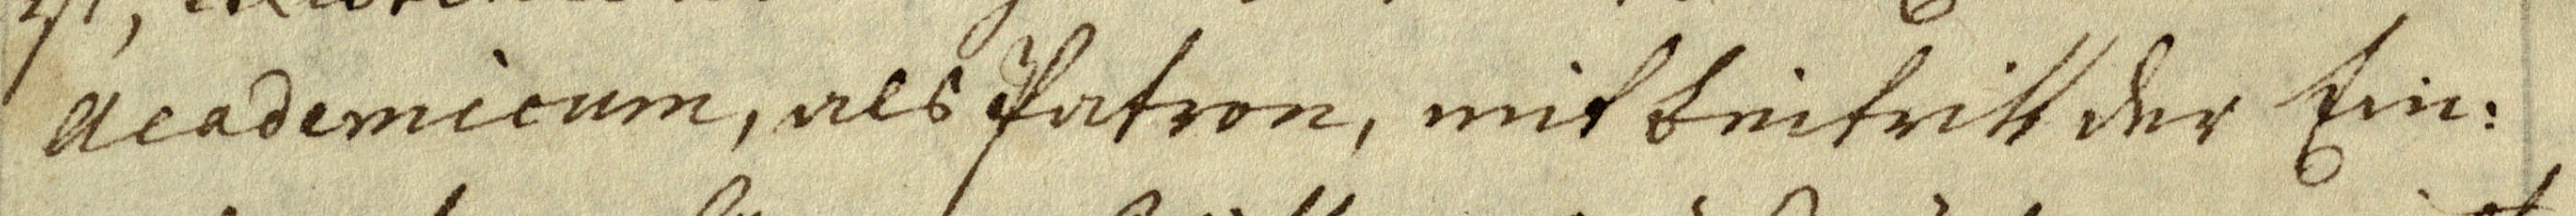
Academicum, als Patron, mit Beitritt der Ein¬
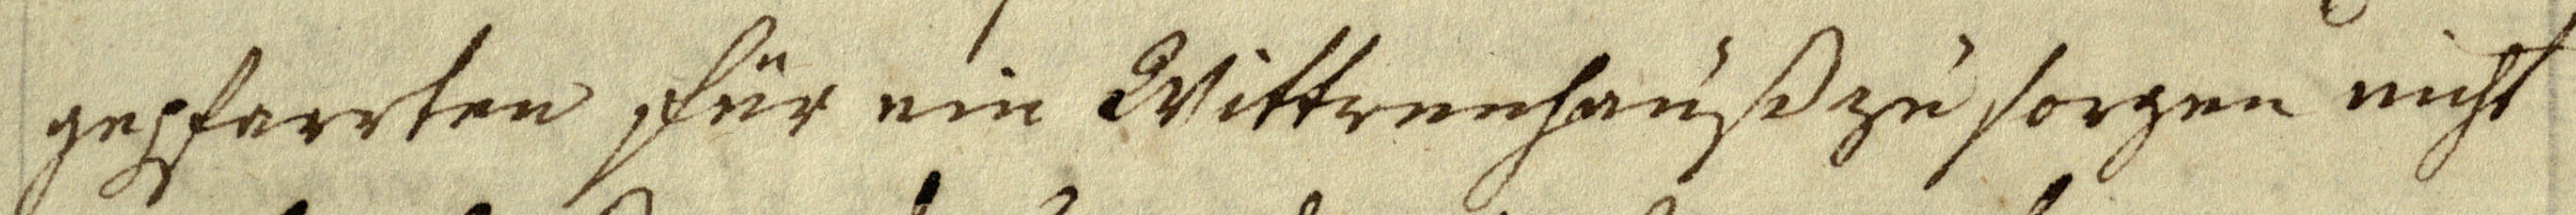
gepfarrten für ein Wittwenhauß zu sorgen nicht
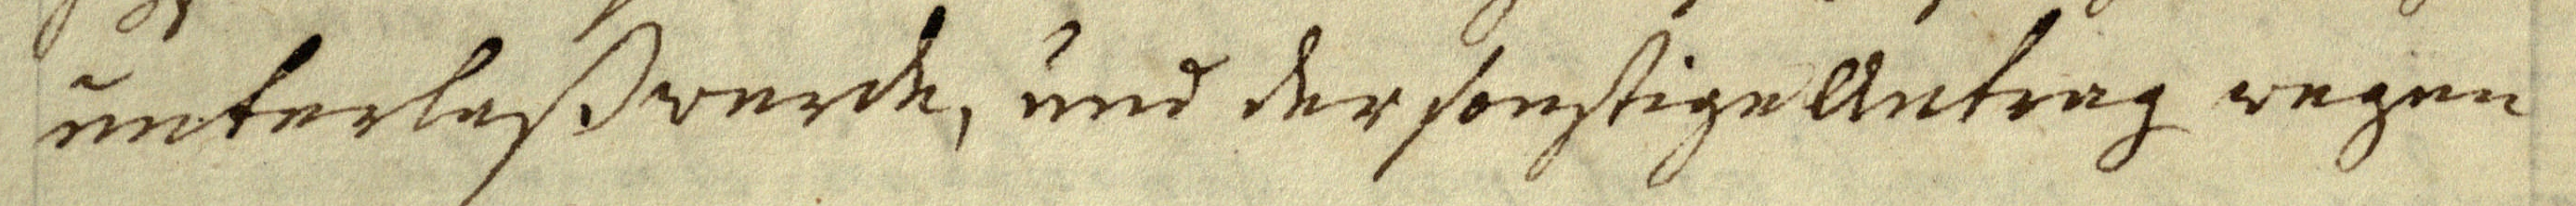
unterlaß werde, und der sonstige Antrag wegen
